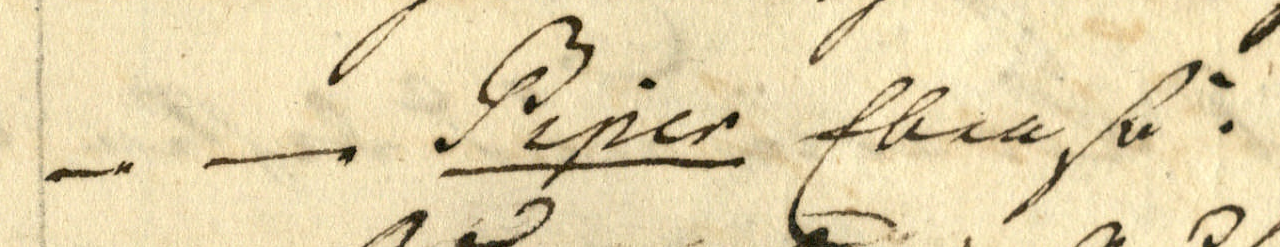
Piper. Eben so.
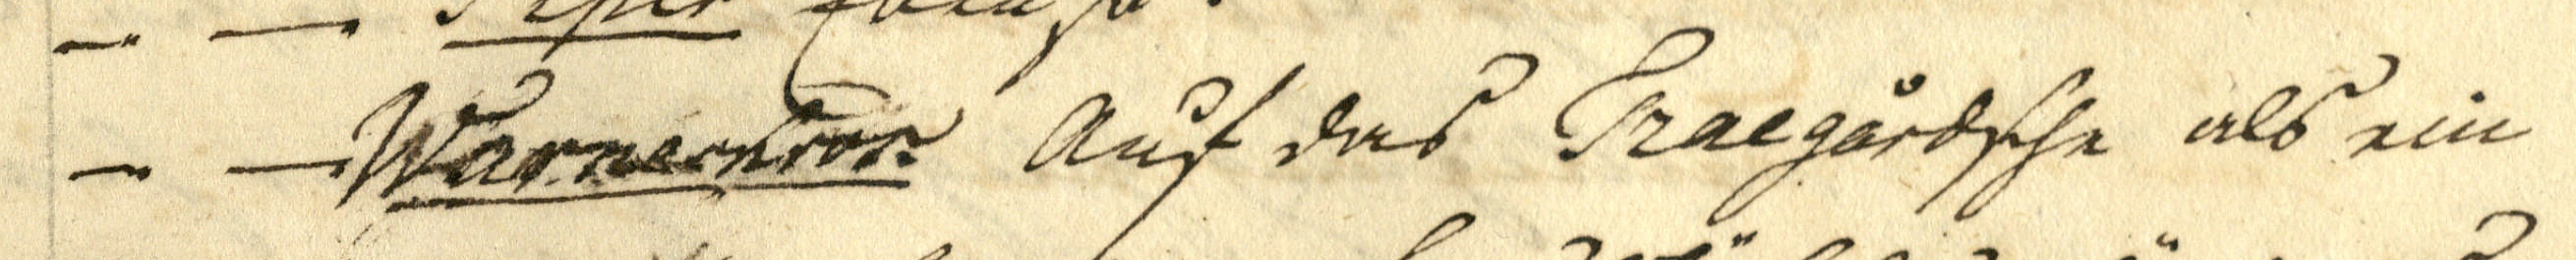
Warneckros. Auf das Traegårdsche als ein
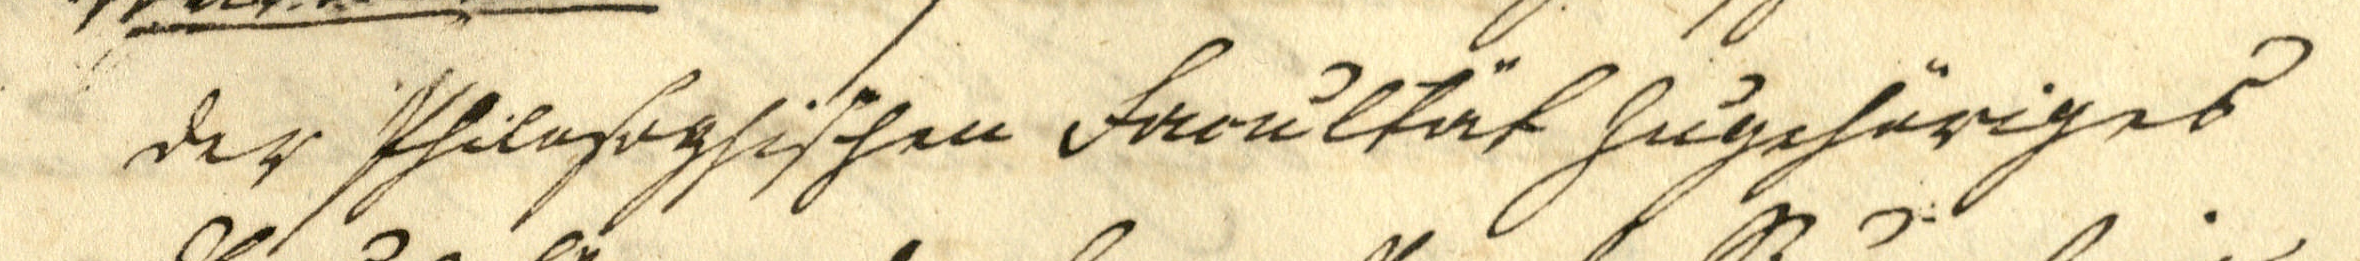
der Philosophischen Facultät zugehöriges
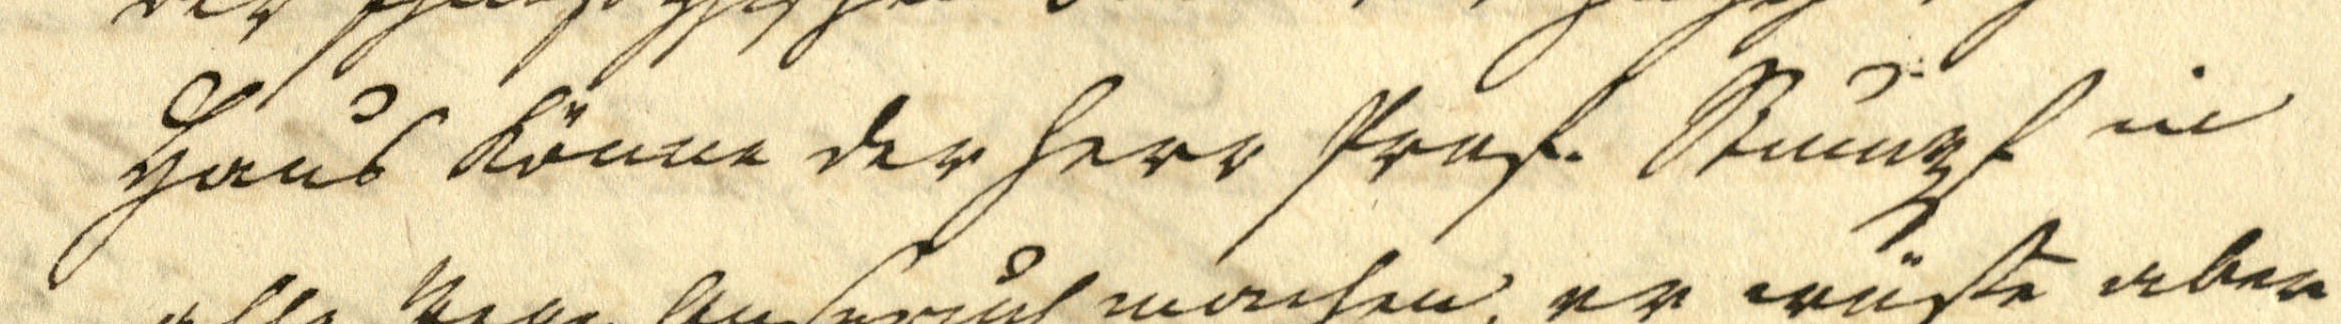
Haus könne der Herr Prof. Stumpf in
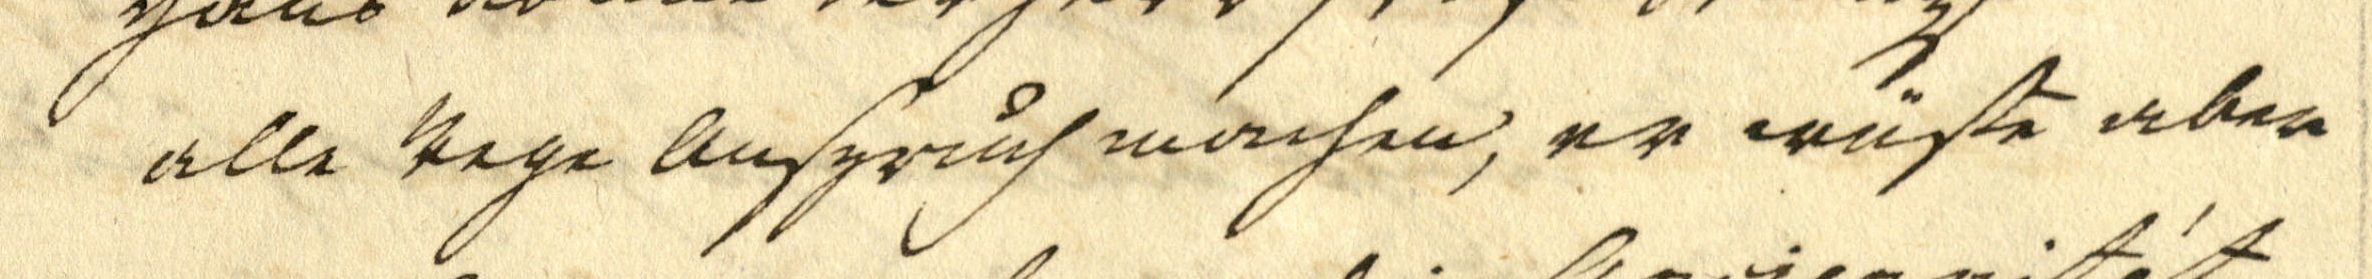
alle Wege Anspruch machen, er wüßte aber
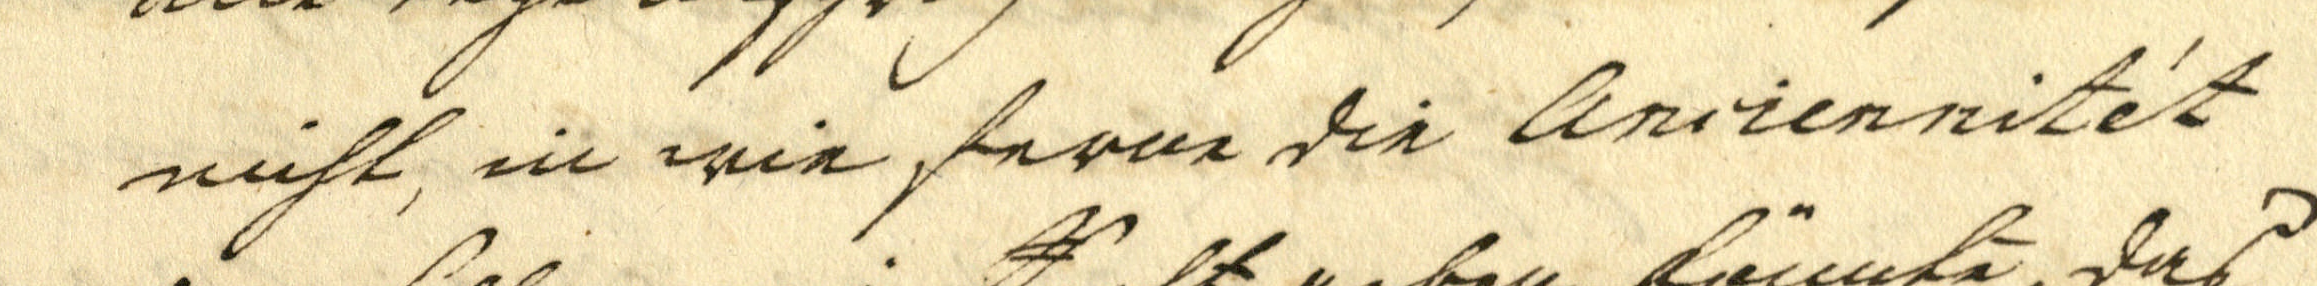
nicht, in wie ferne die Anciennitet
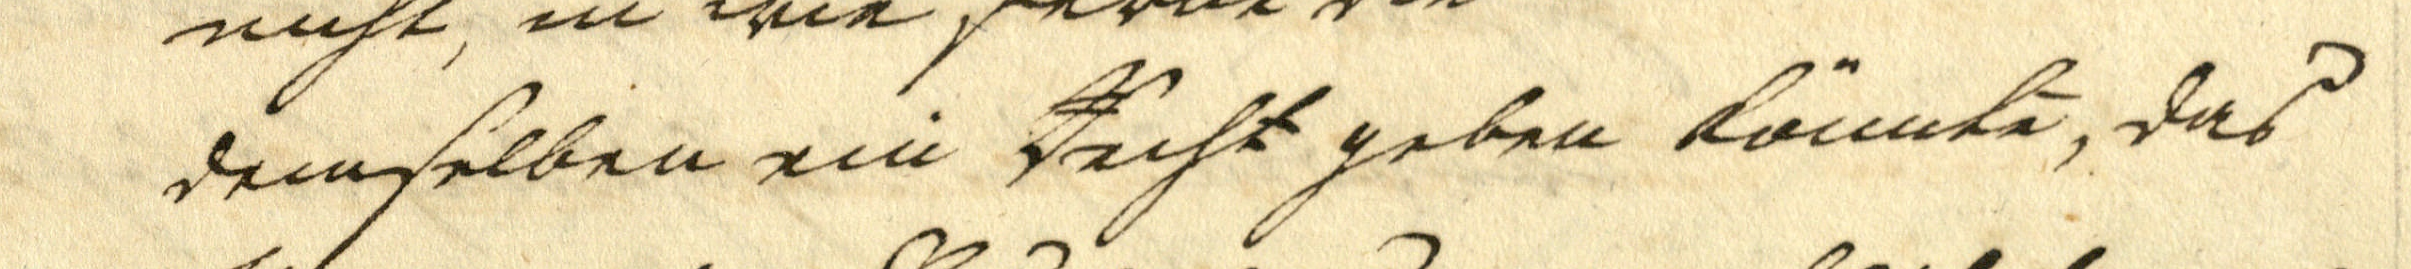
demselben ein Recht geben könnte, das
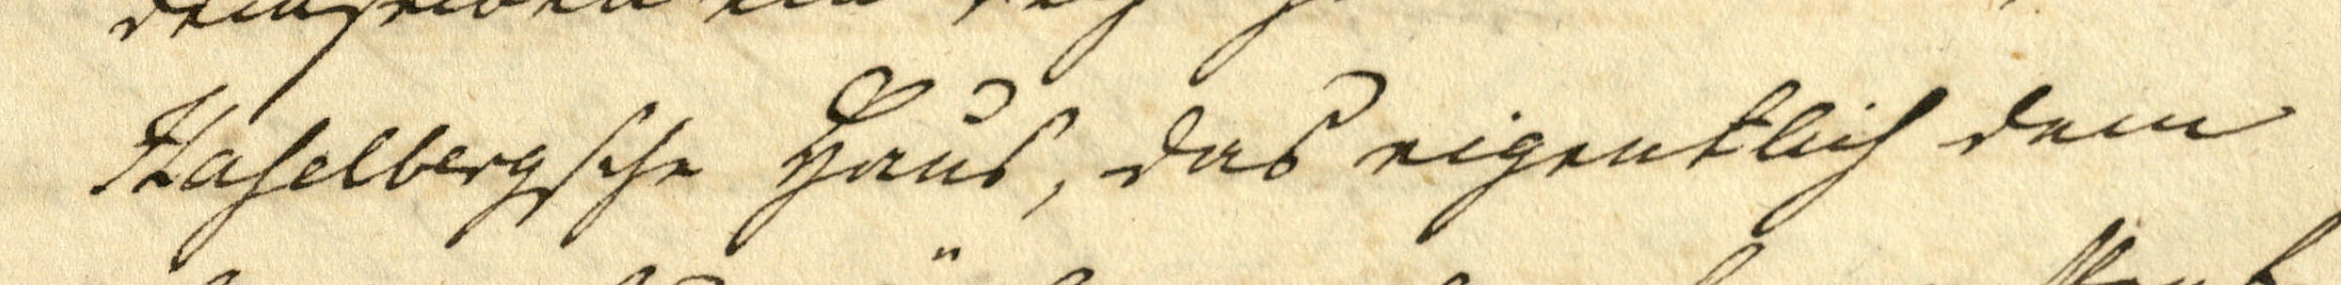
Haselbergsche Haus, das eigentlich dem
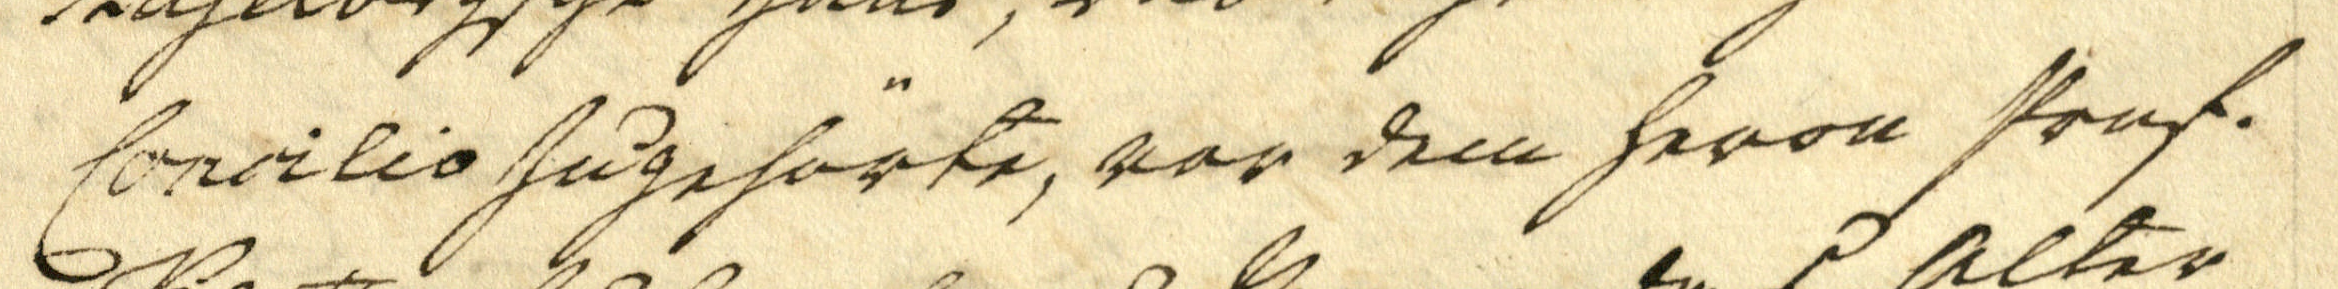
Concilio zugehörte, vor dem Herrn Prof.
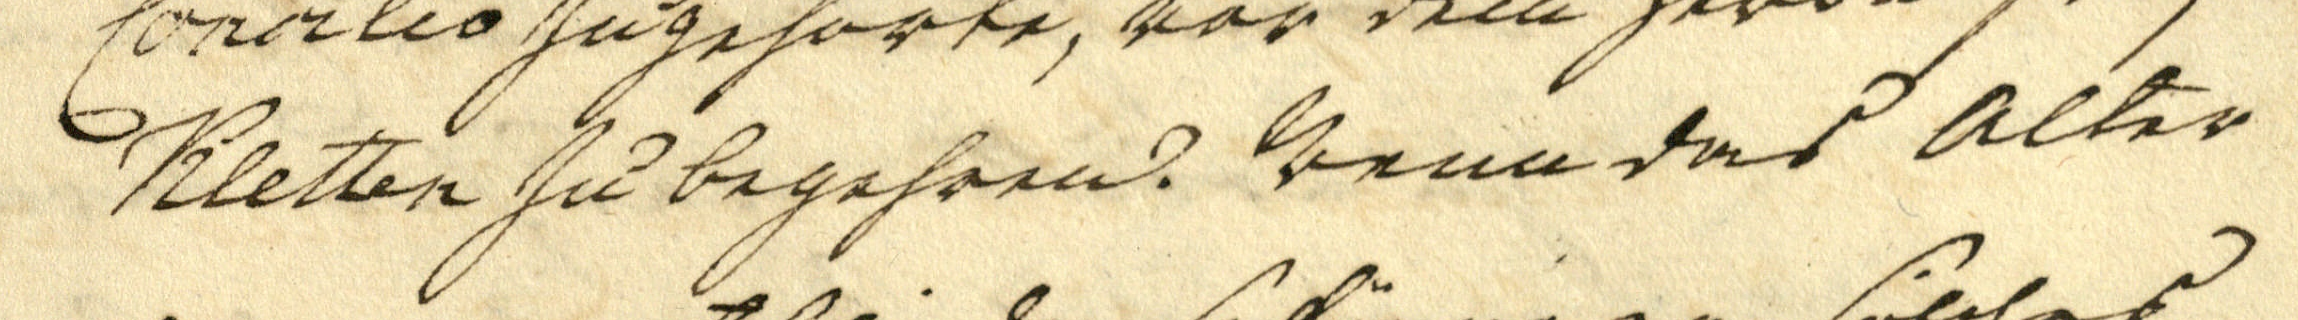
Kletten zu begehren. Wenn das Alter
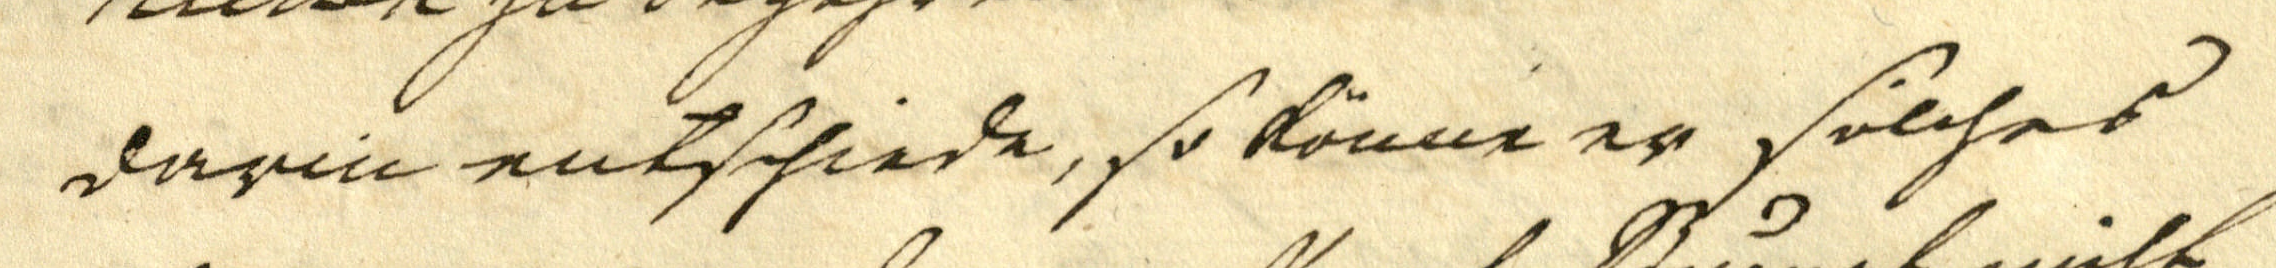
darin entschiede, so könne er solches
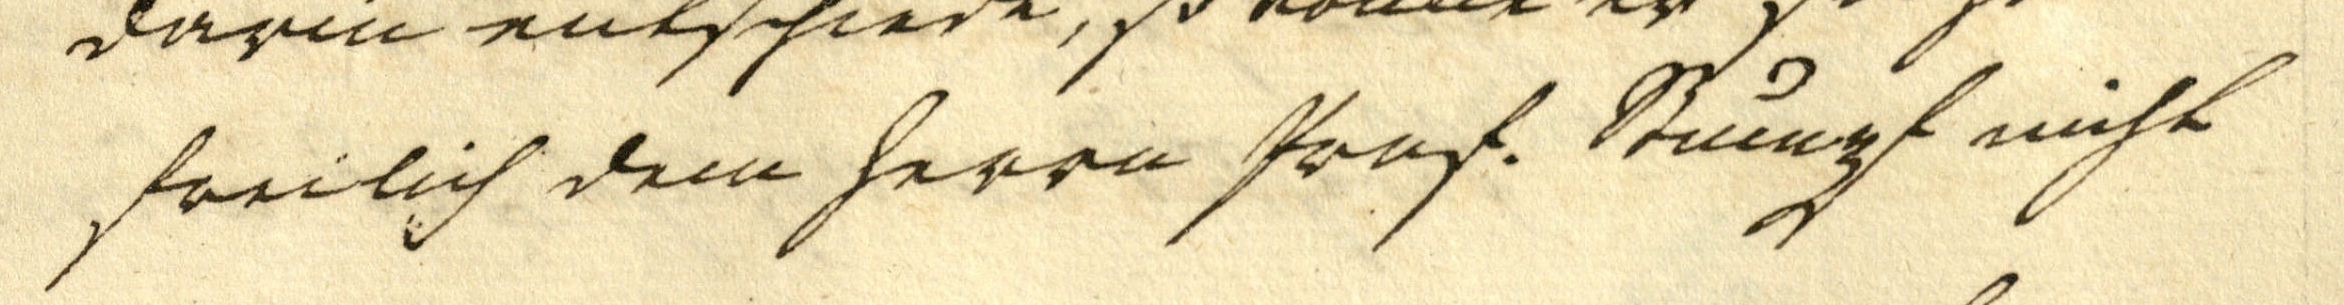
freilich dem Herrn Prof. Stumpf nicht
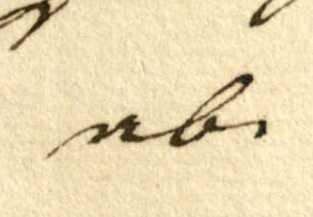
ab
